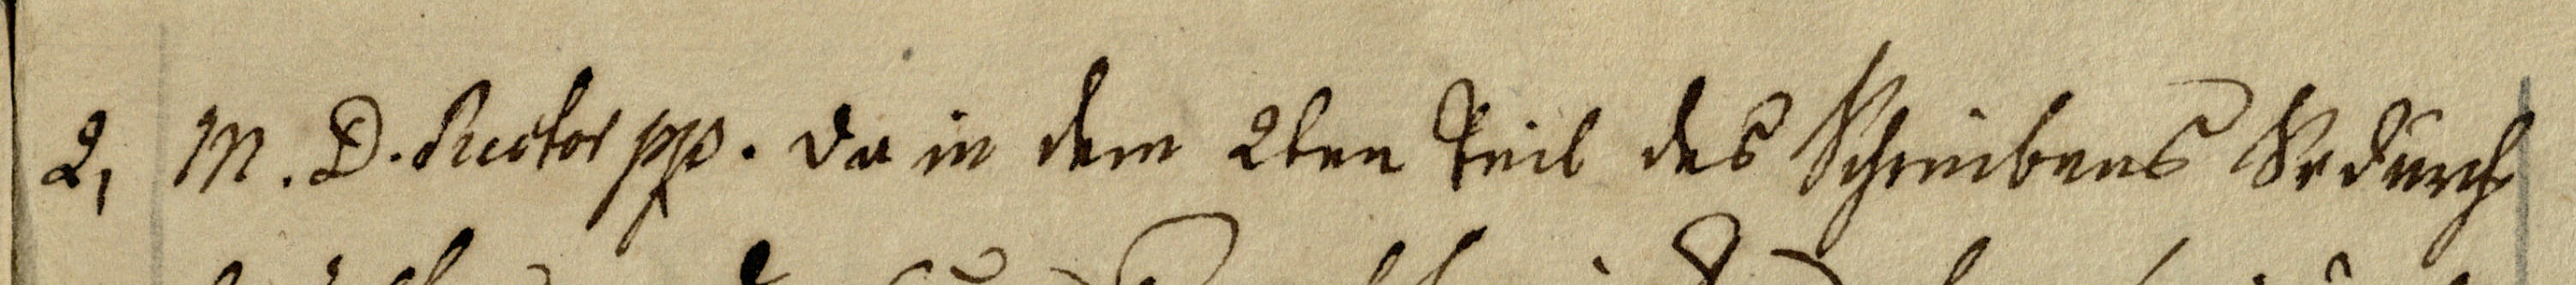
2. M. D. Rector pp. Da in dem 2 ten Teil des Schreibens Sr Durch¬
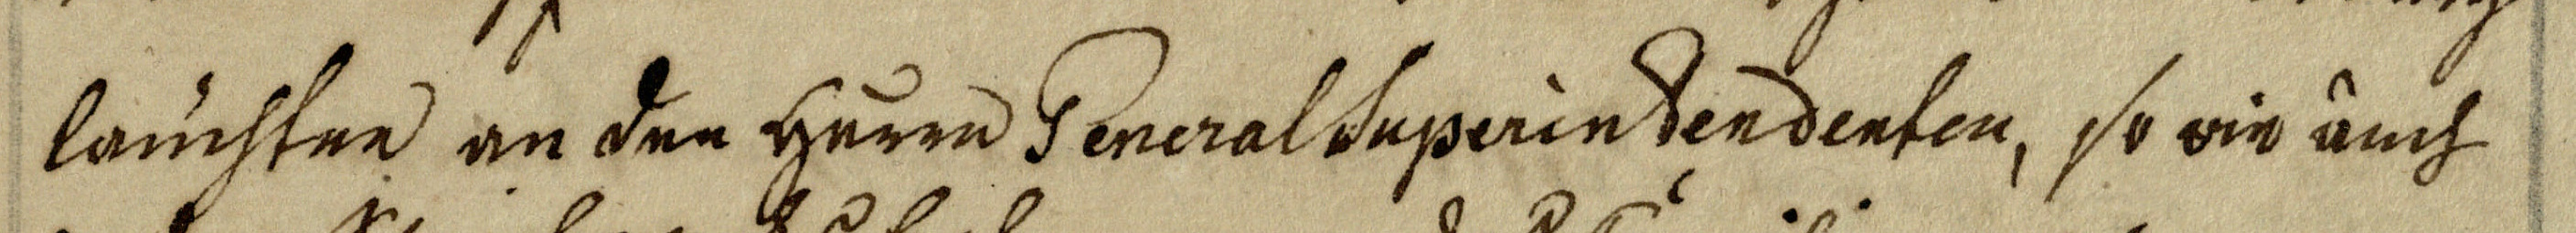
lauchten an den Herrn GeneralSuperintendenten, so wie auch
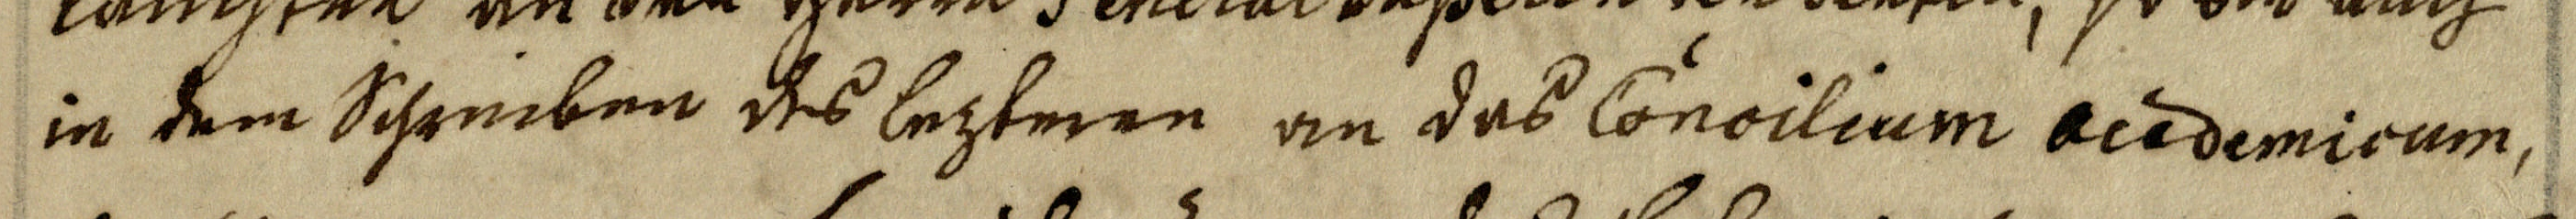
in dem Schreiben des lezteren an das Concilium Academicum,
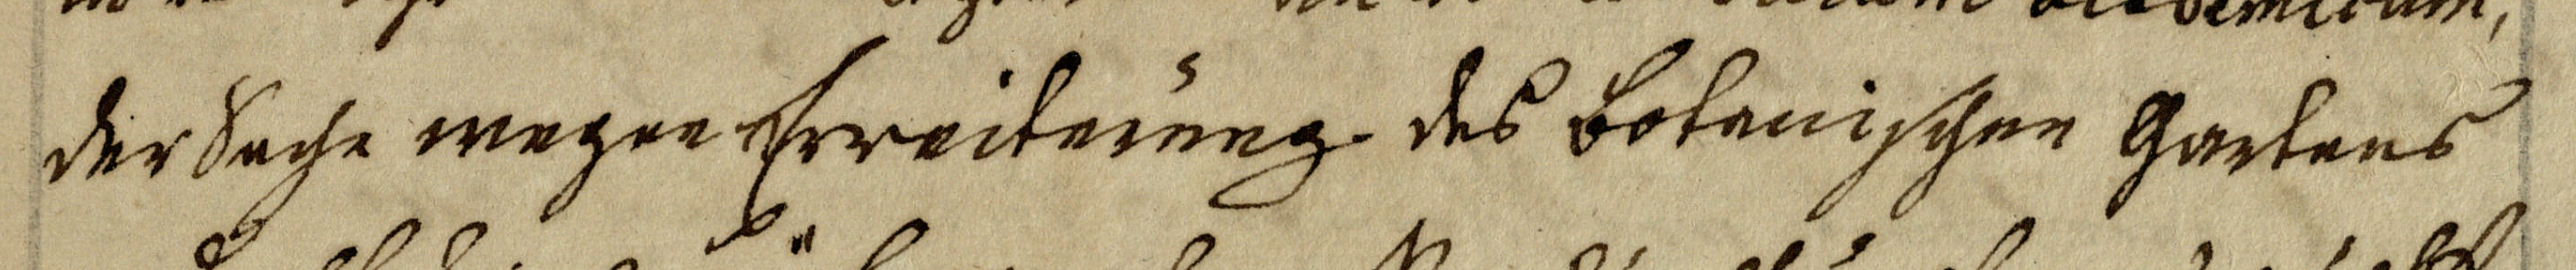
der Sache wegen Erweiterung des Botanischen Gartens
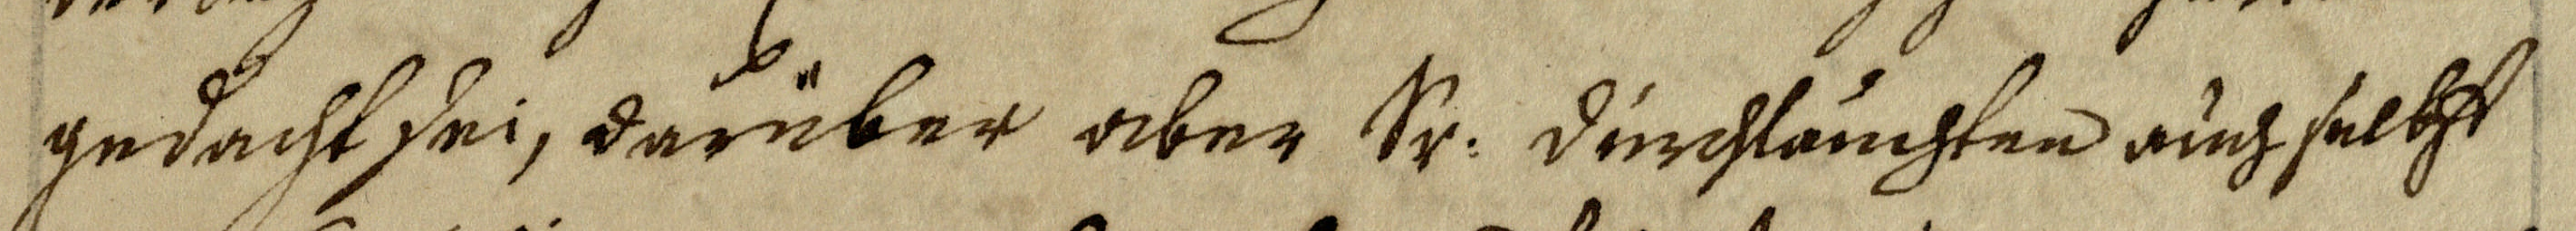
gedacht sei, darüber aber Sr Durchlauchten auch selbst
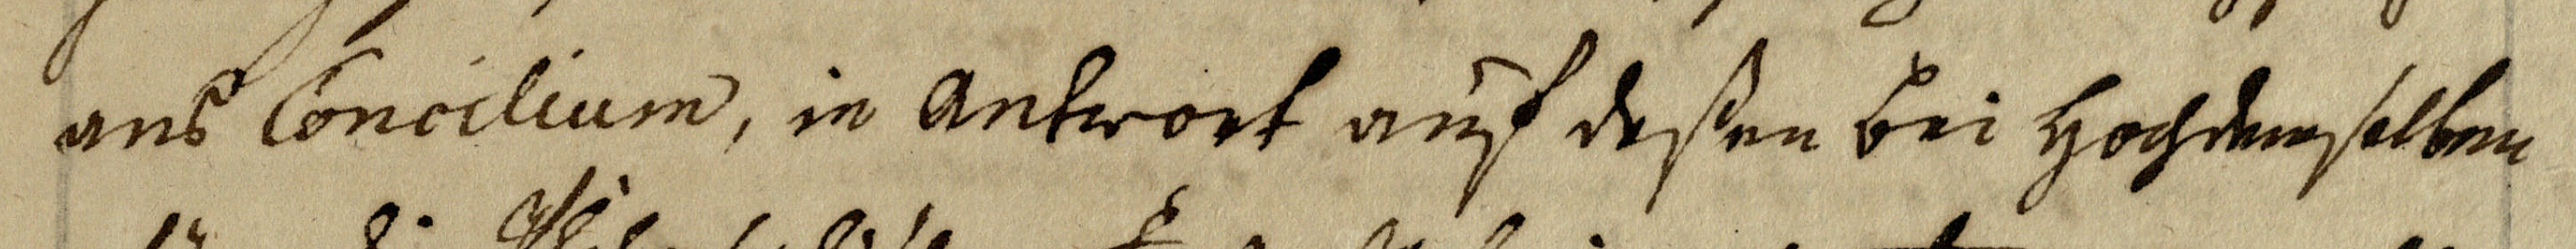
ans Concilium, in Antwort auf dessen bei Hochdemselben
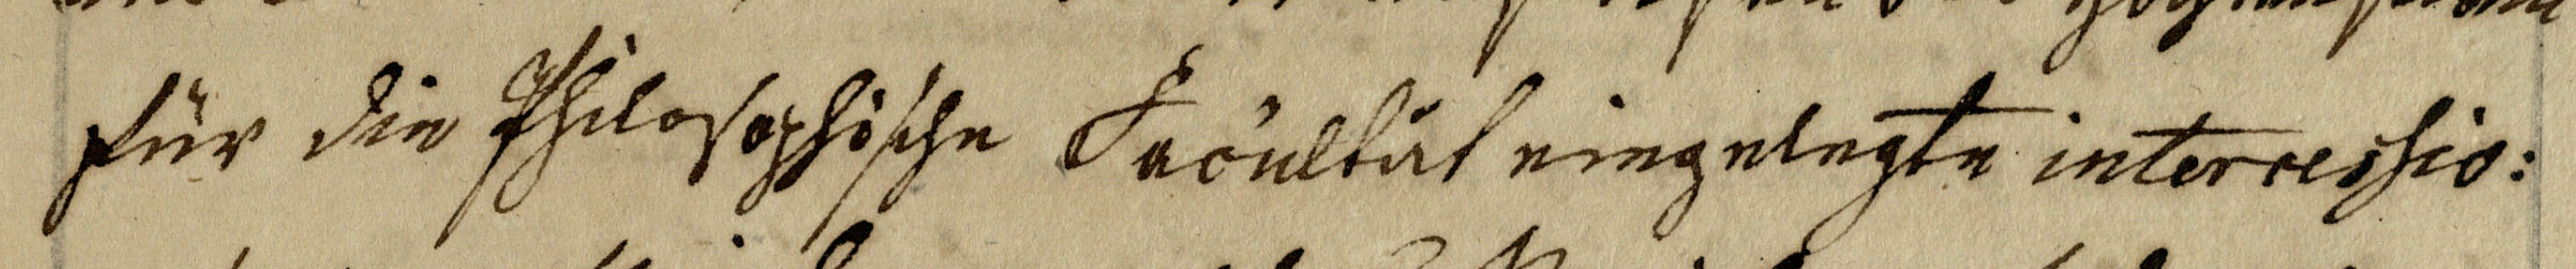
für die Philosophische Facultät eingelegte intercessio¬
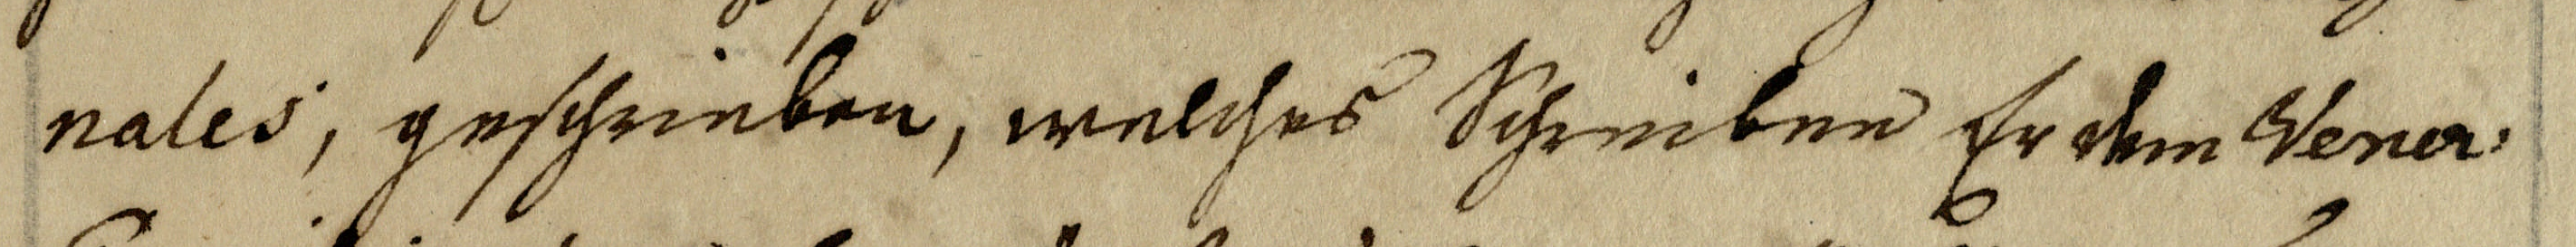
nales, geschrieben, welches Schreiben Er dem Vener.
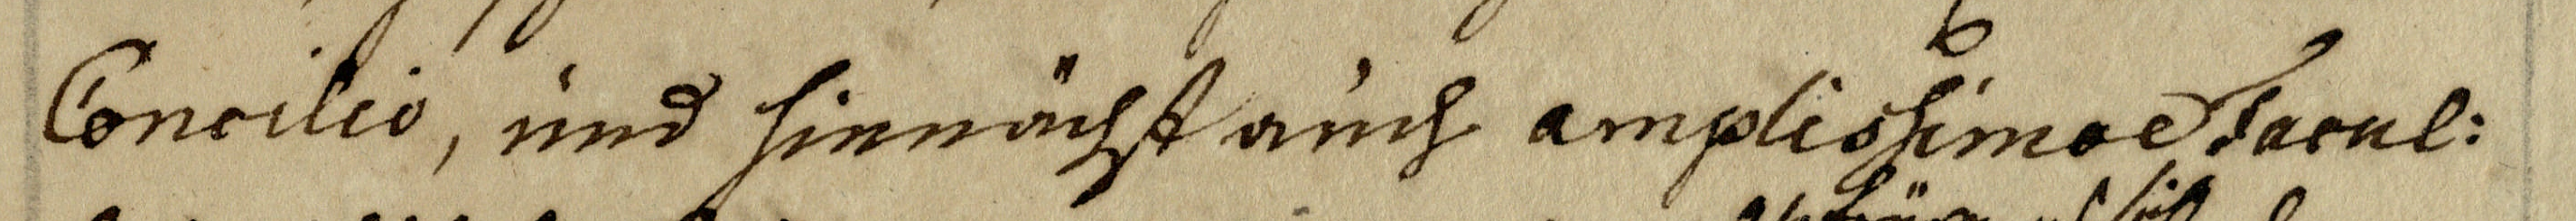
Concilio, und hienächst auch amplissimae Facul¬
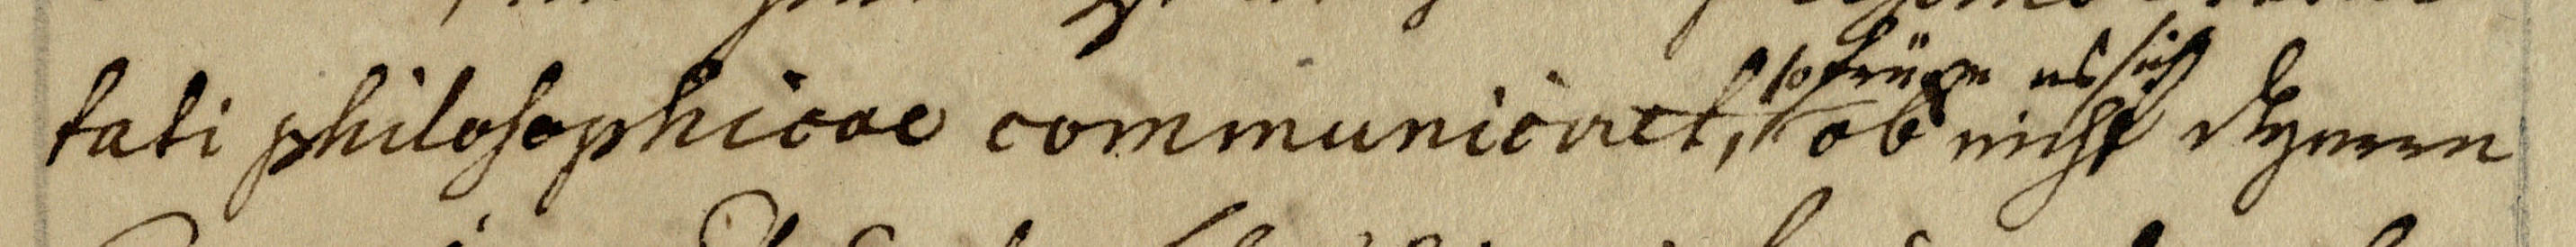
tati philosophicae communiciret, so früge es sich, ob nicht dHerrn
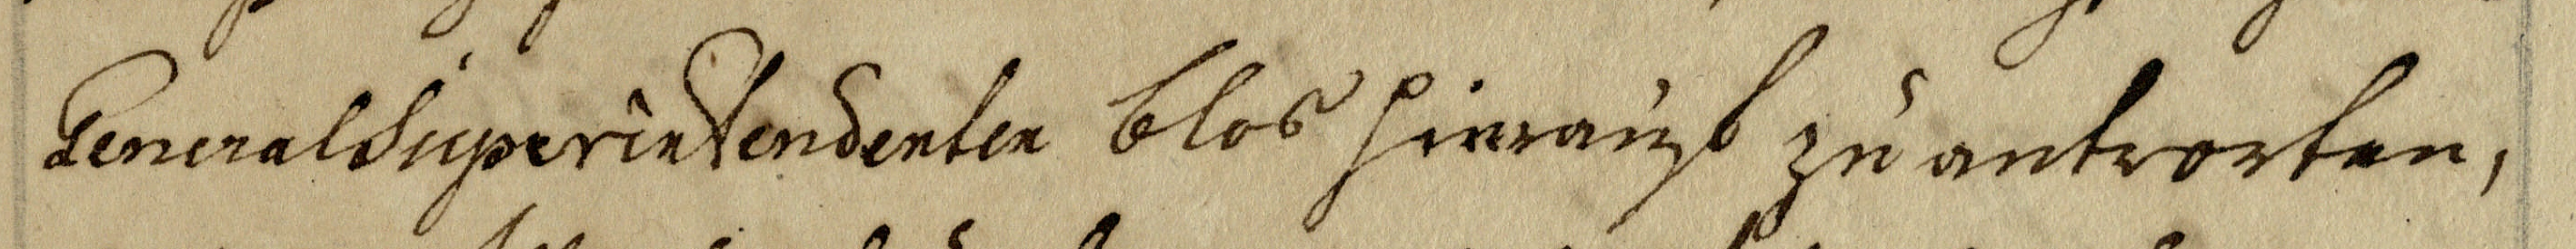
GeneralSuperintendenten blos hierauf zu antworten,
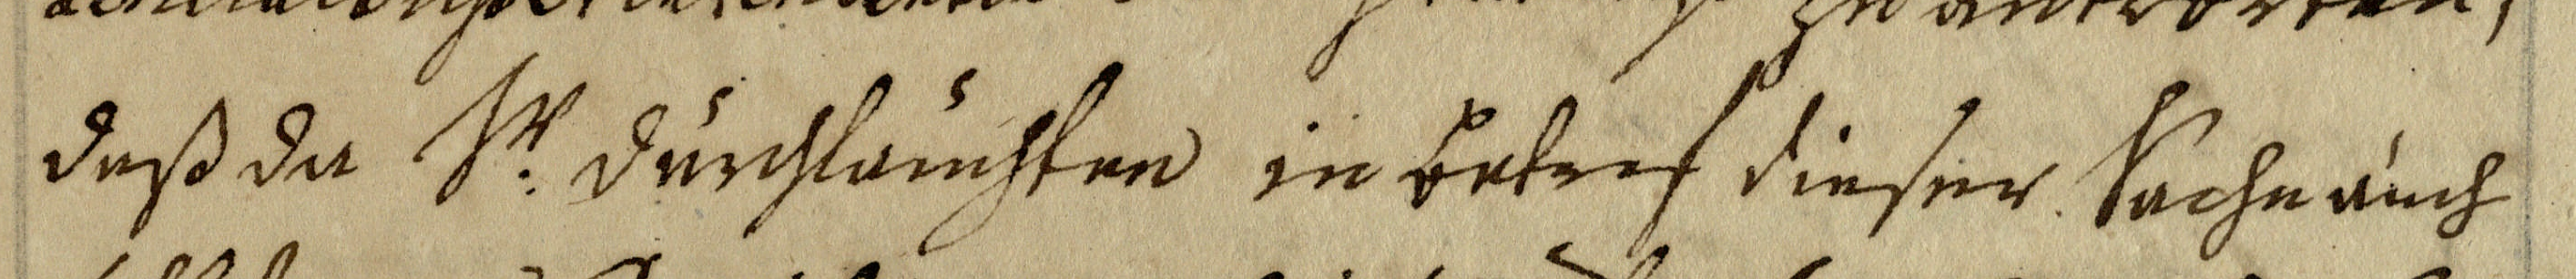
daß da Sr Durchlauchten in Betref dieser Sache auch
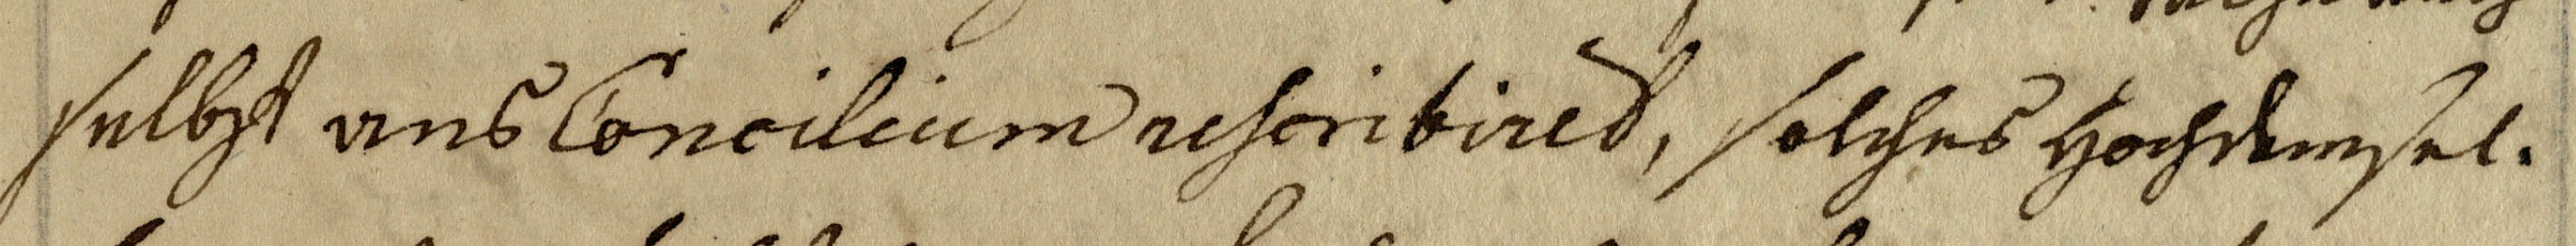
selbst aus Concilium rescribiret, solches Hochdemsel¬
